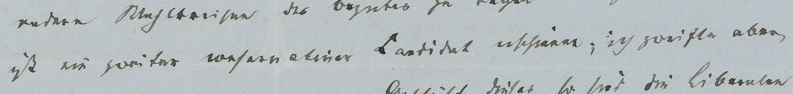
ist ein zweiter conservativer Candidat erschienen; ich zweifle aber,
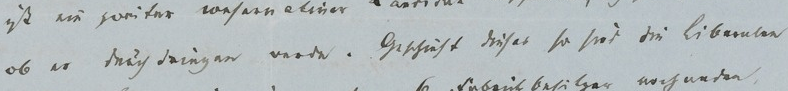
ob er durchdringen werde. Geschieht dieses so sind die Liberalen
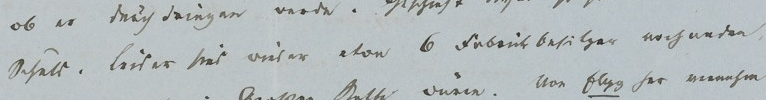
Schuld. Leider sind wieder etwa 6 Fabrikbesitzer vorhanden,
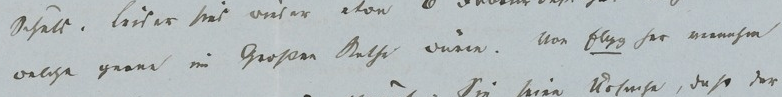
welche gerne im Großen Rathe wären. Von Elgg her vernahm
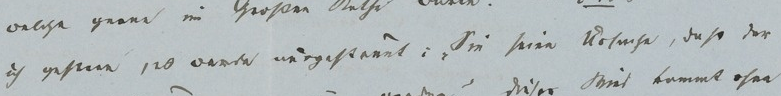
ich gestern, es werde ausgestreut: «Sie seien Ursache, daß der
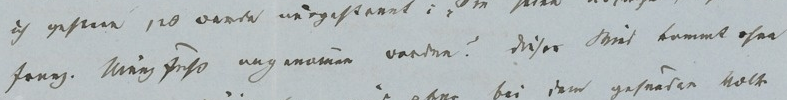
franz. Münzfuß angenommen worden.» Dieser Wind kommt ohne
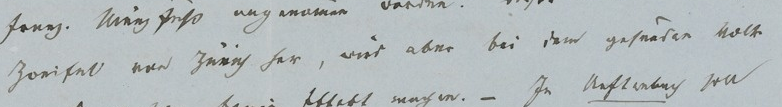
Zweifel von Zürich her, wird aber bei dem gesunden Volk
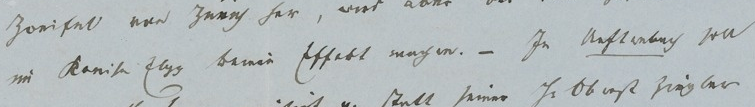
im Kreise Elgg keinen Effekt machen. – In Neftenbach soll
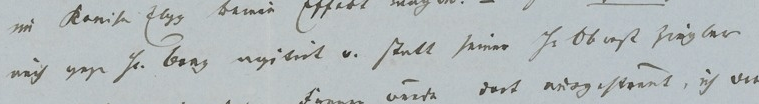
auch gegen Hr. Benz agitirt &. statt seiner Hr. Oberst Ziegler
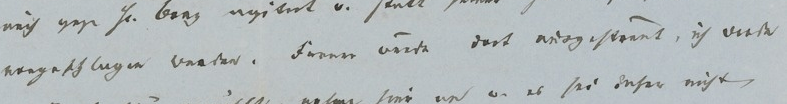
vorgeschlagen werden. Ferner wurde dort ausgestreut, ich werde
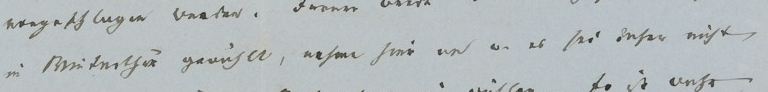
in Winterthur gewählt, nehme hier an &. es sei daher nicht
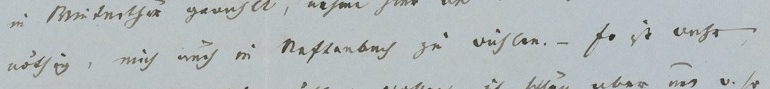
nöthig, mich auch in Neftenbach zu wählen. – Es ist wahr,
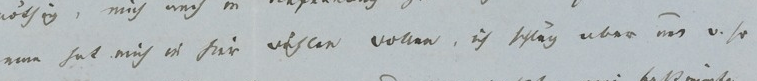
man hat mich in hier wählen wollen, ich schlug aber aus &. so
